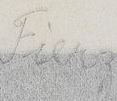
Zürich
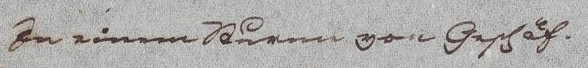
In einem Sturme von Geschäf-
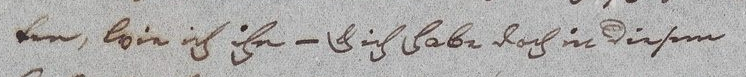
ten, wie ich ihn – & ich habe doch in diesem
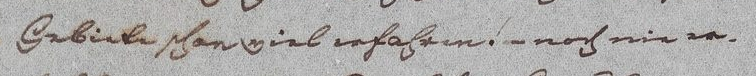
Gebiete schon viel erfahren! – noch nie er-
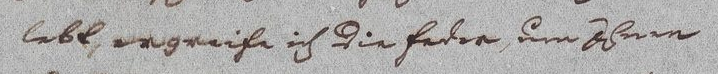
lebt, ergreife ich die Feder, um Ihnen
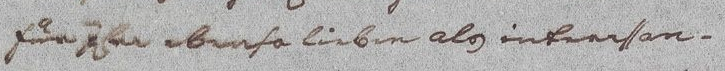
für Ihre ebenso lieben als interessan-
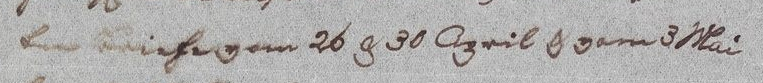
ten Briefe vom 26 & 30 April & vom 3 Mai
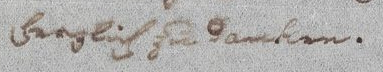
herzlich zu danken.
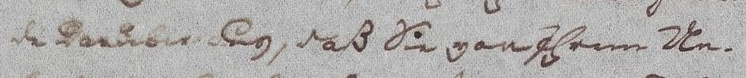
de darüber aus, daß Sie von Ihrem Un-
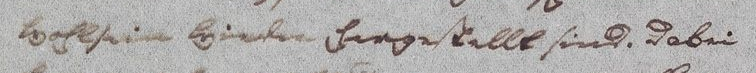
wohlsein wieder hergestellt sind. Dabei
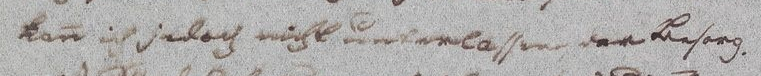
kann ich jedoch nicht unterlassen, der Besorg-
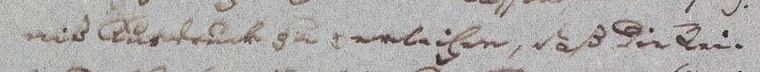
niß Ausdruck zu verleihen, daß die Rei-
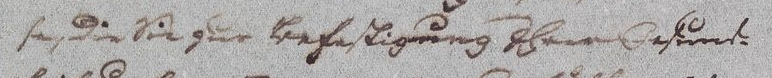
se, die Sie zur Befestigung Ihrer Gesund-
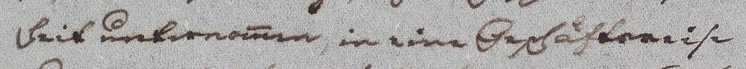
heit unternommen, in eine Geschäftsreise
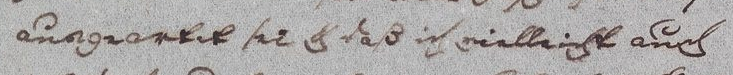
ausgeartet sei & daß ich vielleicht auch
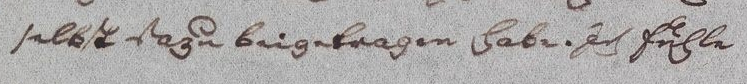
selbst dazu beigetragen habe. Ich fühle
